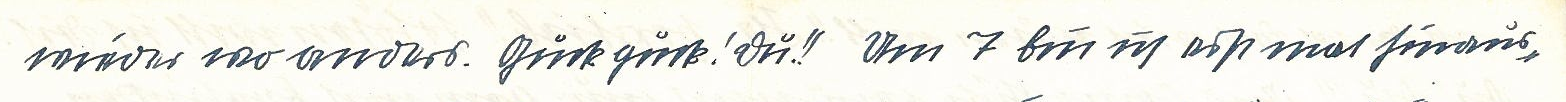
wieder woanders. Guck guck! Du!! Um 7 bin ich erst mal hinaus
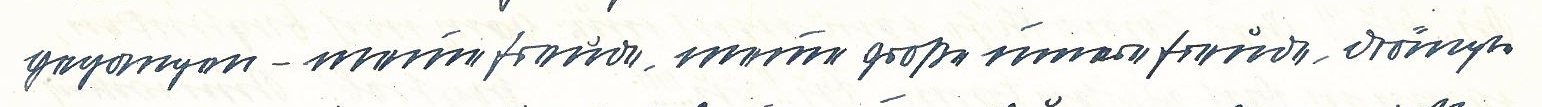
gegangen – meine Freude, meine große innere Freude, drängte
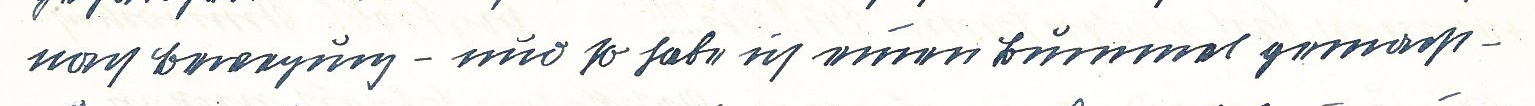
nach Bewegung – und so habe ich einen Bummel gemacht –
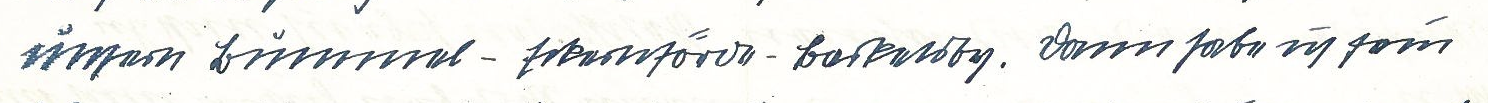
unsern Bummel – Eckernförde – Barkelsby. Dann habe ich fein
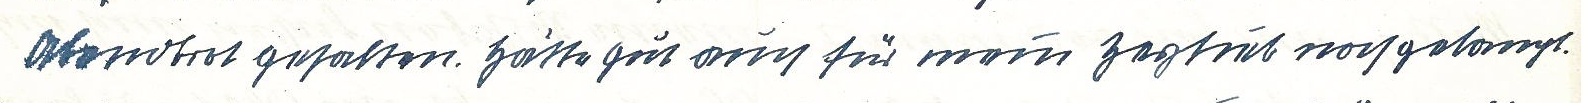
Abendbrot gehalten. Hätte gut auch für mein Herzlieb noch gelangt.
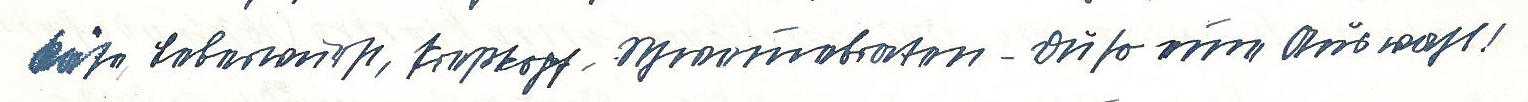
Käse, Leberwurst, Preßkopf, Schweinebraten – Du so eine Auswahl!
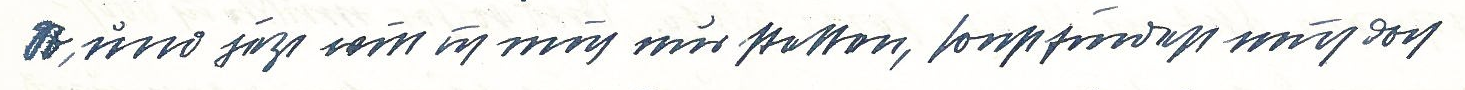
So, und jezt will ich mich nur stellen, sonst findest mich doch
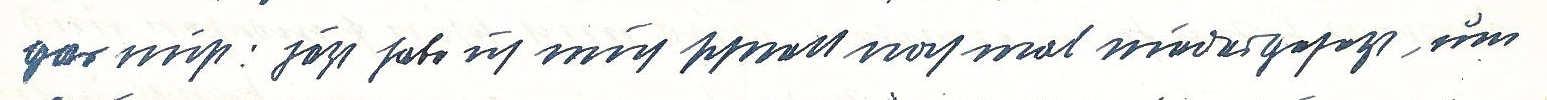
gar nicht: jetzt habe ich mich schnell noch mal niedergelegt, um
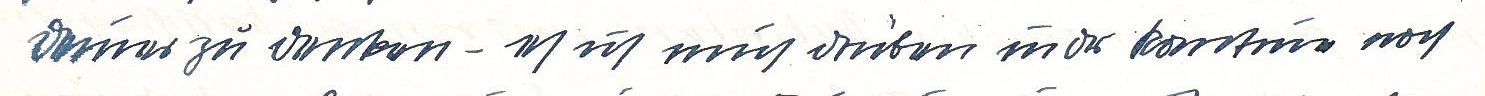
Deiner zu denken – ehe ich mich drüben in der Kantine noch
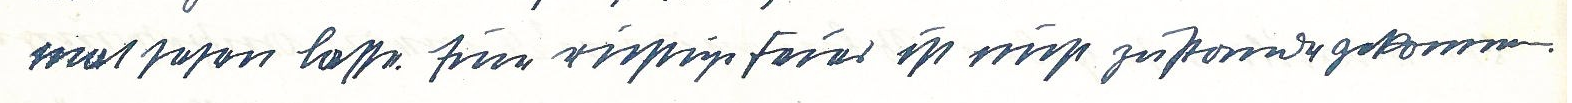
mal sehen lasse. Eine richtige Feier ist nicht zustande gekommen.
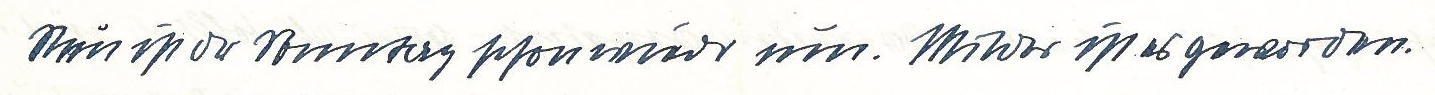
Nun ist der Sonntag schon wieder um. Milder ist es geworden.
